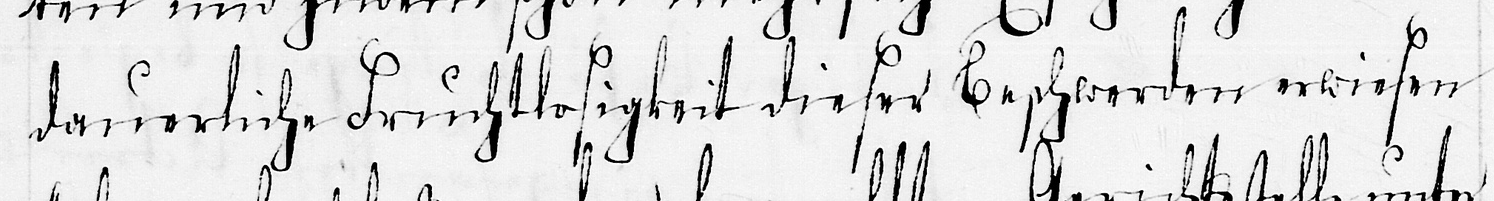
dauerliche Fruchtlosigkeit dieser Beschwerden erwiesen
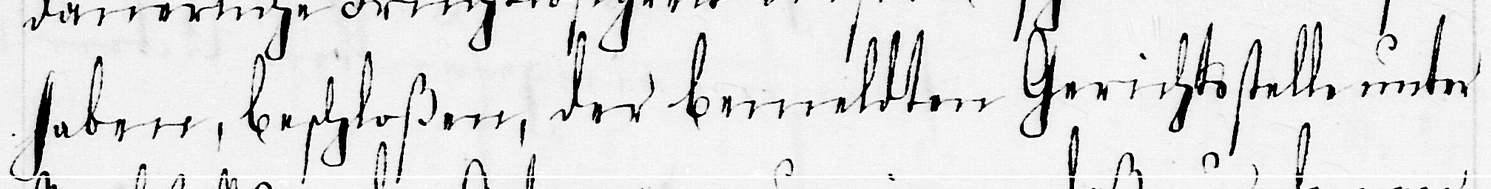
haben, beschloßen, der bemeldten Gerichtsstelle unter
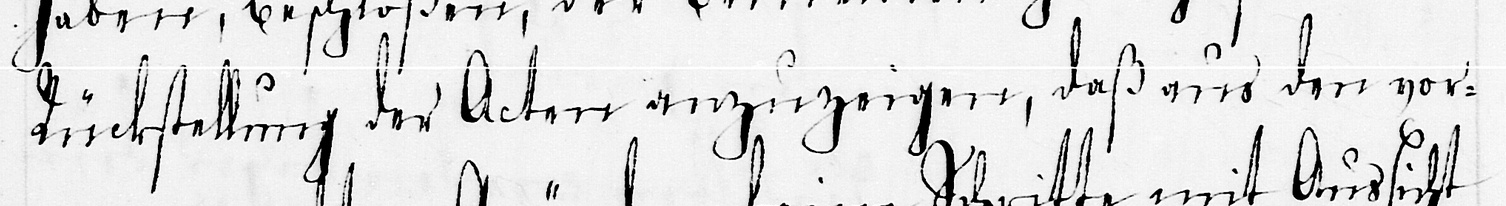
Rückstellung der Acten anzuzeigen, daß aus den vor¬
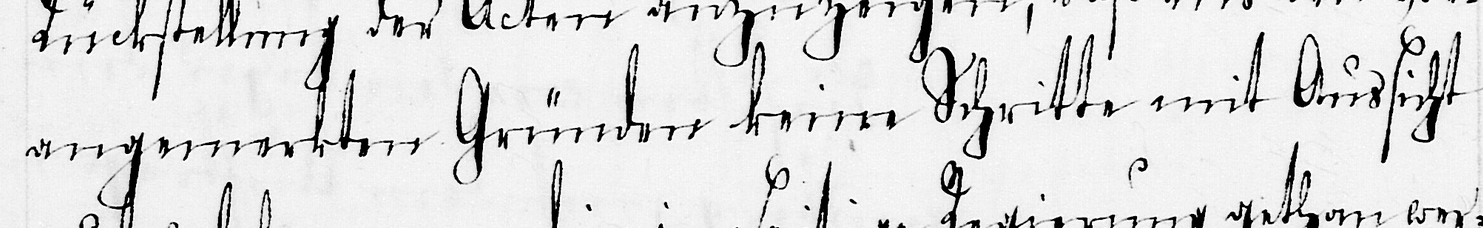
angemerkten Gründen keine Schritte mit Aussicht
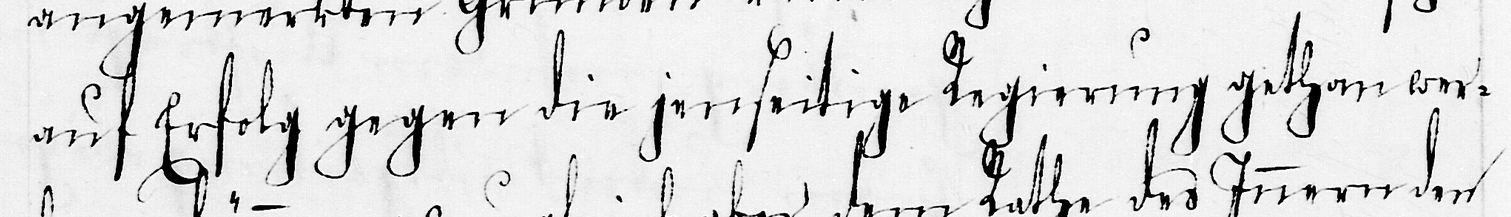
auf Erfolg gegen die jenseitige Regierung gethan wer¬
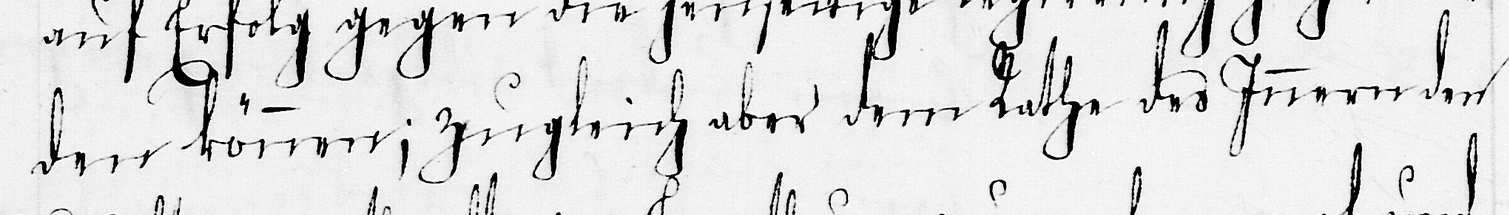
den können; zugleich aber dem Rathe des Innern den
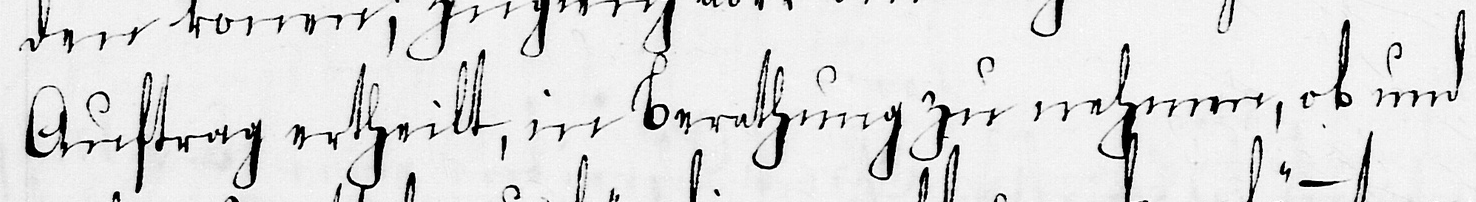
Auftrag ertheilt, in Berathung zu nehmen, ob und
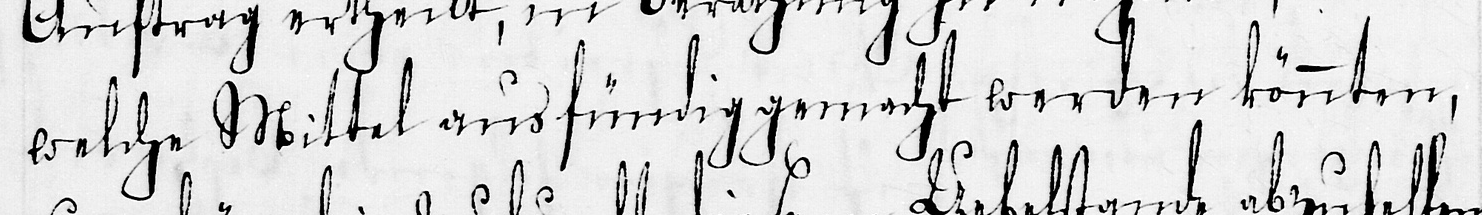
welche Mittel ausfündig gemacht werden könnten,
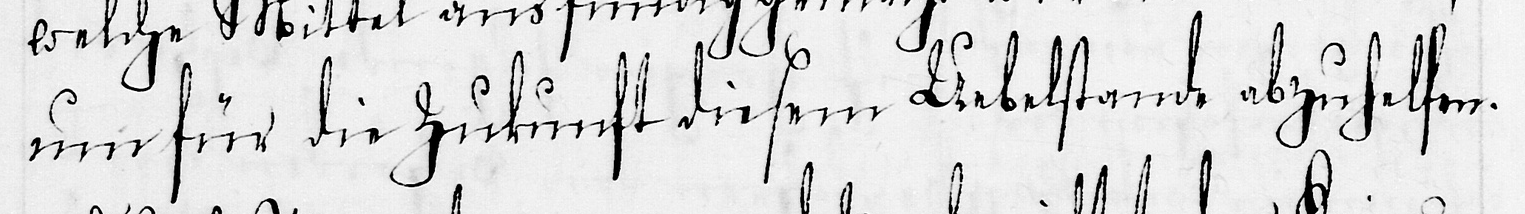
um für die Zukunft diesem Uebelstande abzuhelfen.
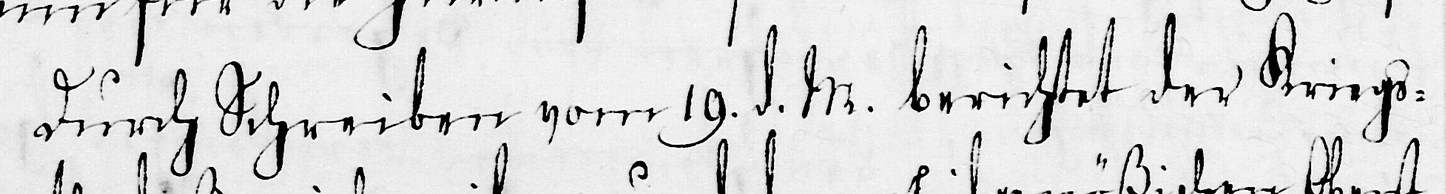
Durch Schreiben vom 19. d. M. berichtet der Kriegs¬
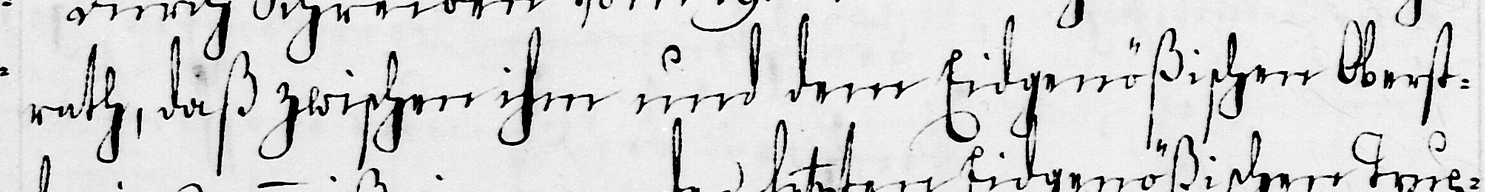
rath, daß zwischen ihm und dem Eidgenößischen Oberst¬
